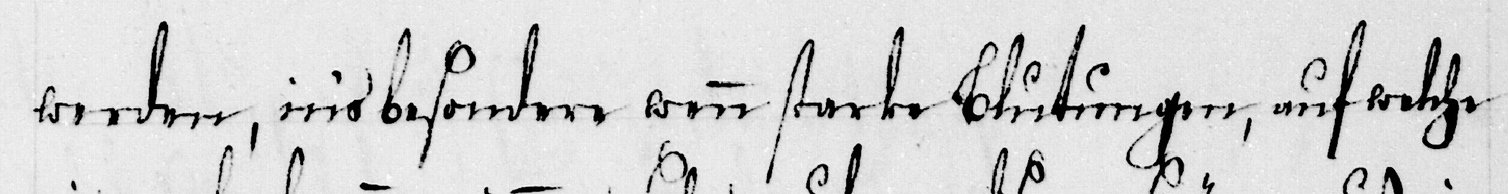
werden, insbesondere wenn starke Blutungen, auf welche
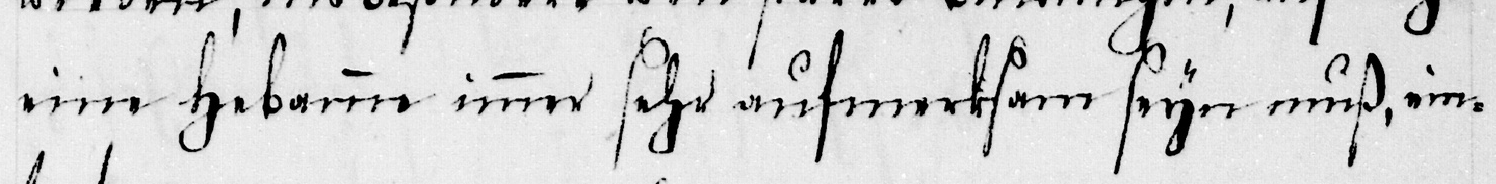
eine Hebamme immer sehr aufmerksam seyn muß, ein¬
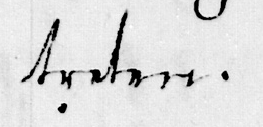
treten.
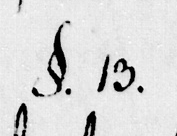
§. 13.
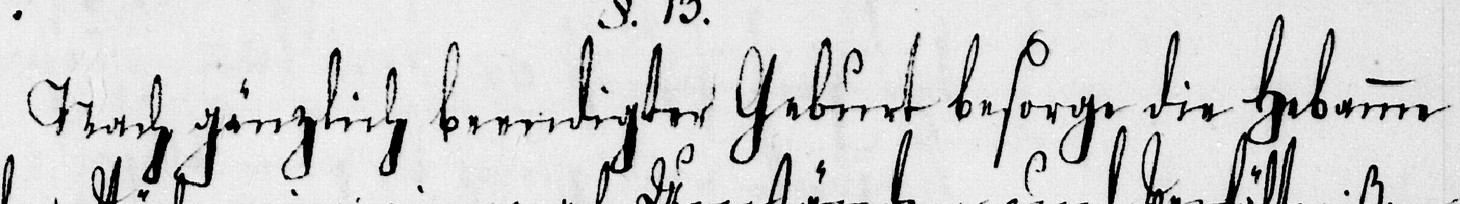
Nach gänzlich beendigter Geburt besorge die Hebamme
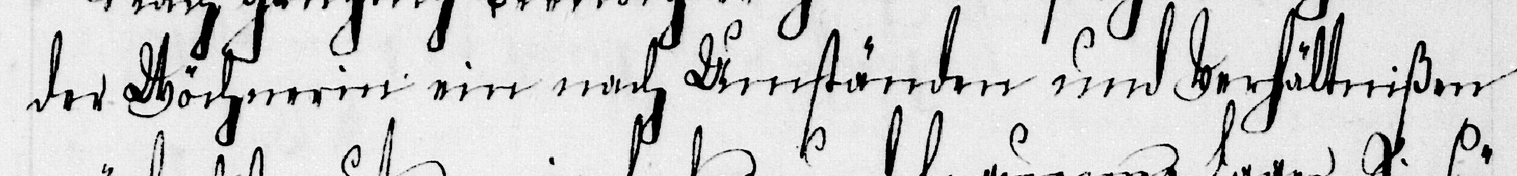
der Wöchnerin ein nach Umständen und Verhältnißen
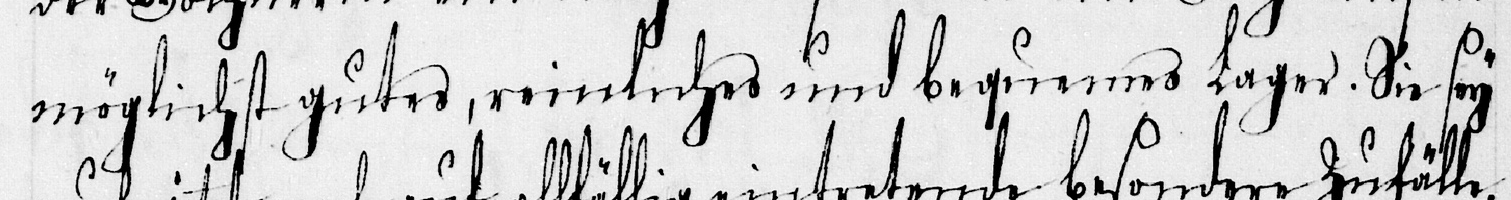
möglichst gutes, reinliches und bequemes Lager. Sie sey
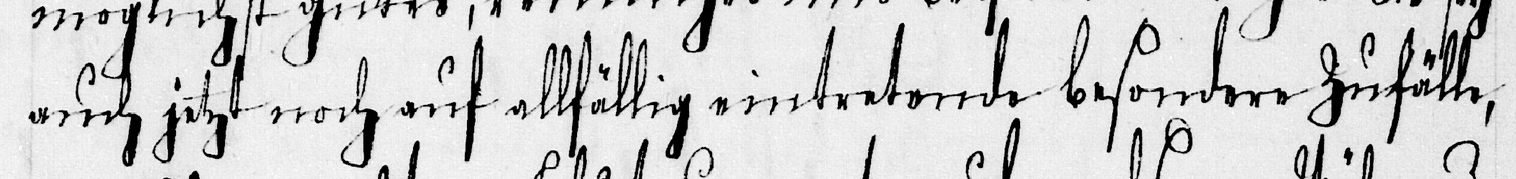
auch jetzt noch auf allfällig eintretende besondere Zufälle,
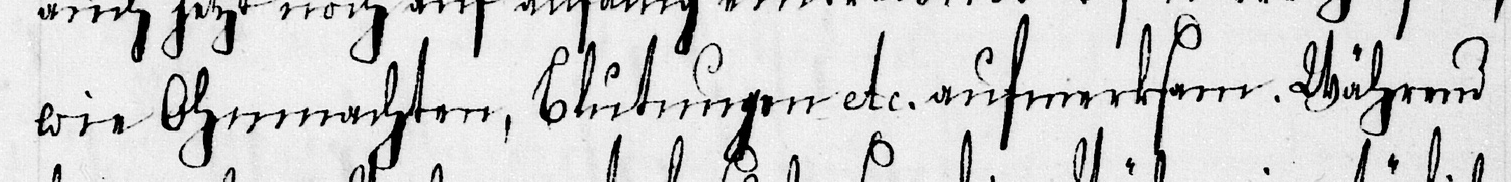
wie Ohnmachten, Blutungen etc. aufmerksam. Während
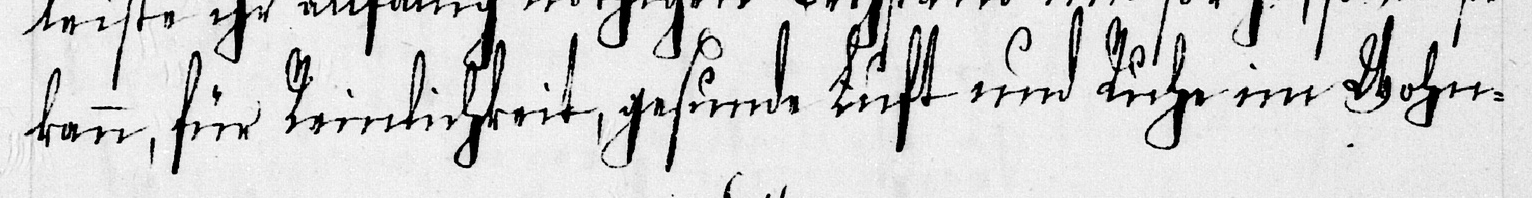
kann, für Reinlichkeit, gesunde Luft und Ruhe im Wohn¬
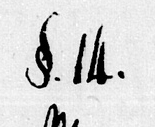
§. 14.
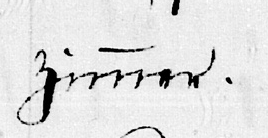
zimmer.
